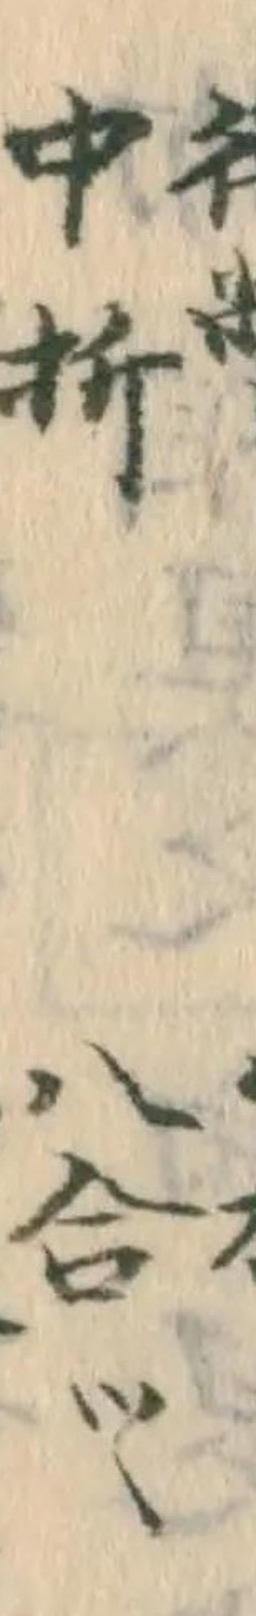中折八合ツヽ
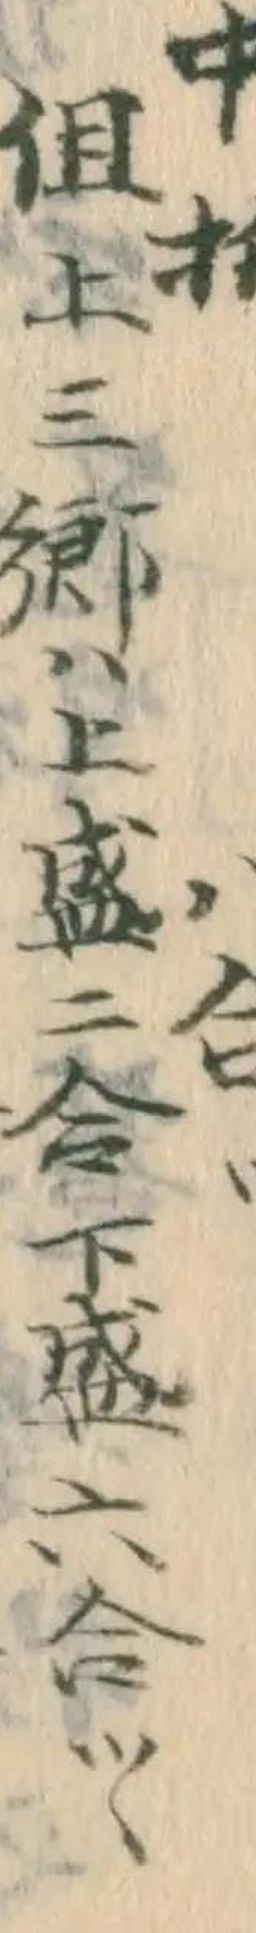且上三郷ハ上盛二合下盛六合ツヽ
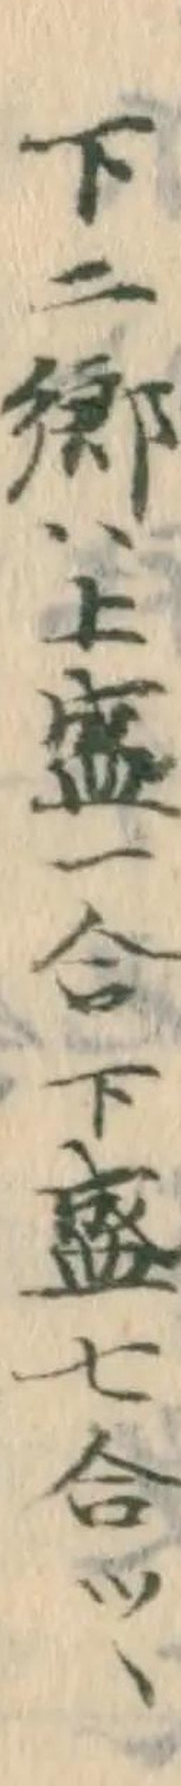社神下二郷ハ上盛一合下盛七合ツヽ
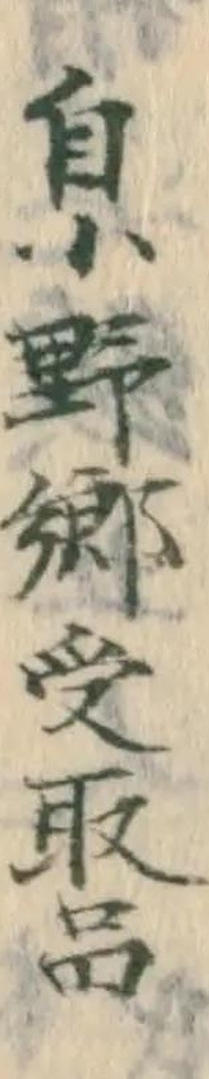西自小野郷受取品
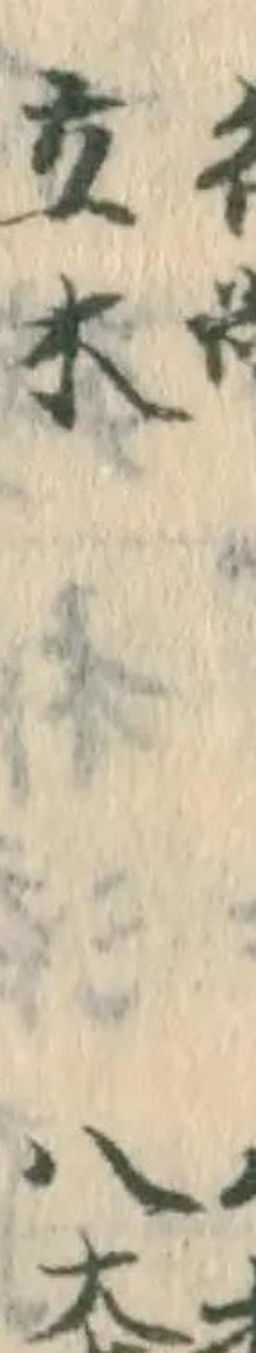立木八本
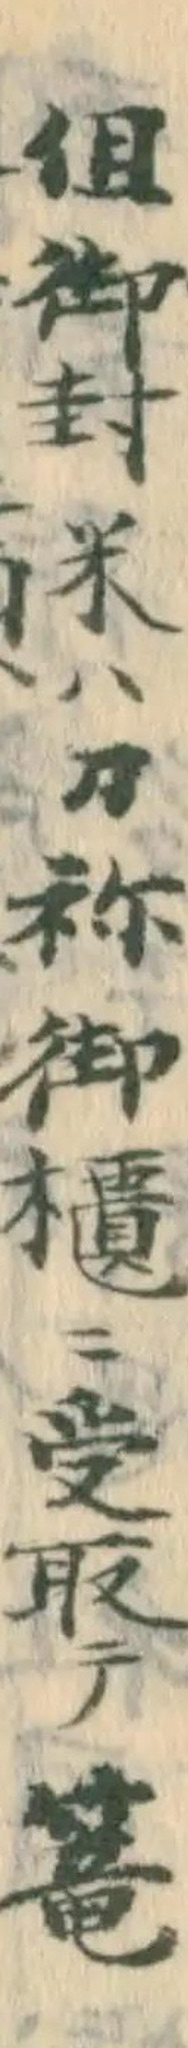但御封米ハ刀禰御櫃ニ受取テ篭
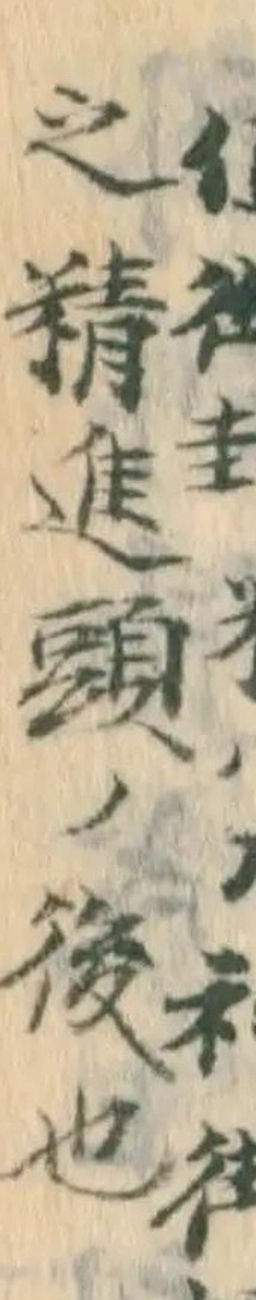之精進頭ノ後也

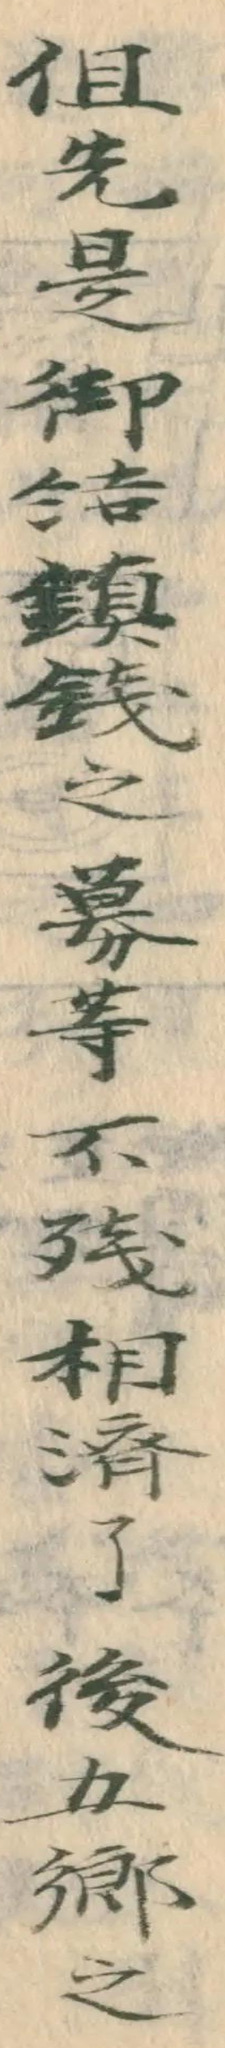但先是御結鎮銭之募等不残相済了後五郷之
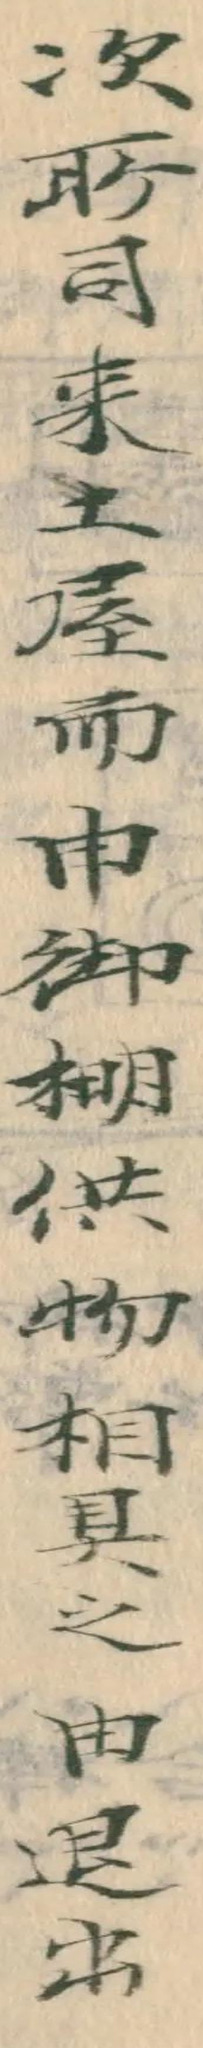次所司来土屋而申御棚供物相具之由退出
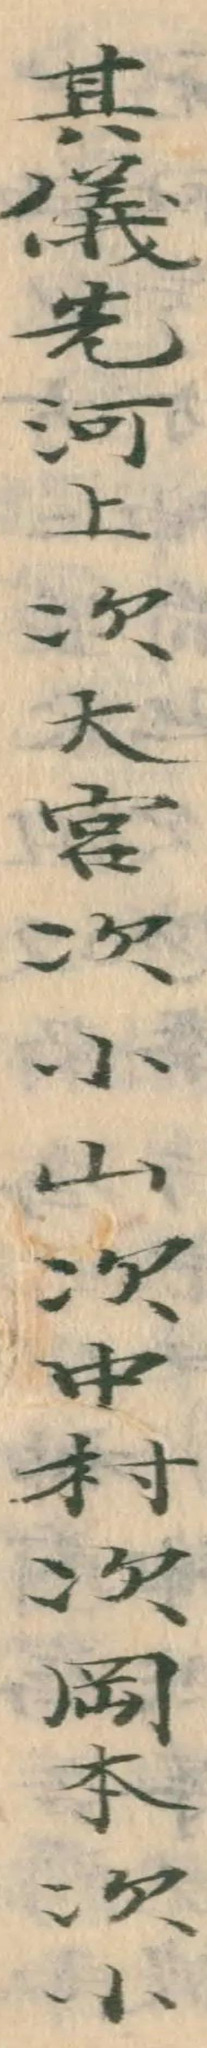其儀先河上次大宮次小山次中村次岡本次小
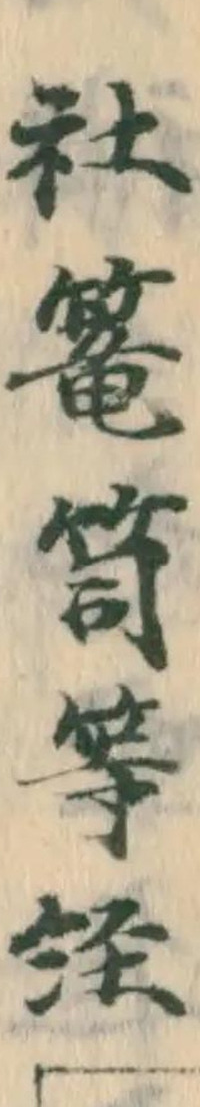社籠笥等経
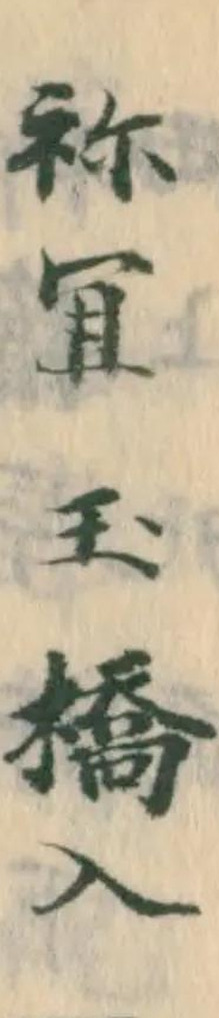禰宜玉橋入
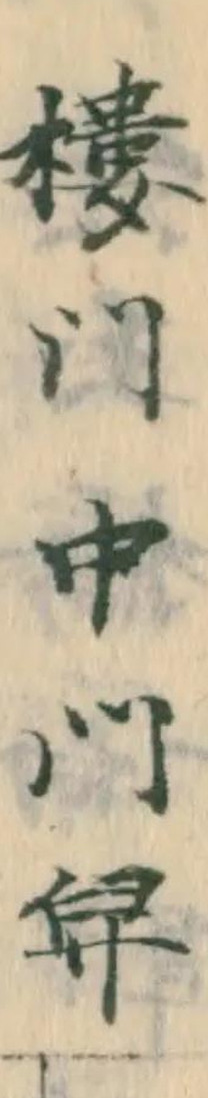楼門中門舁
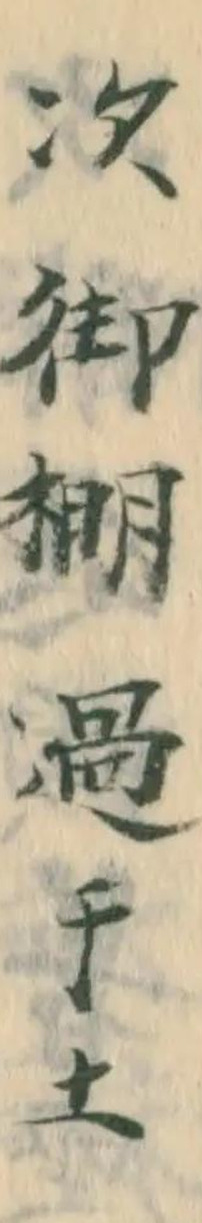次御棚過于土
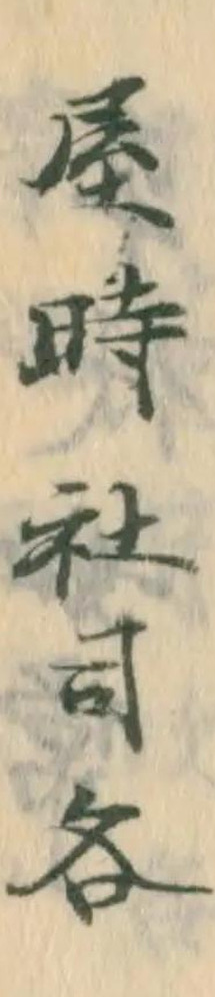屋時社司各

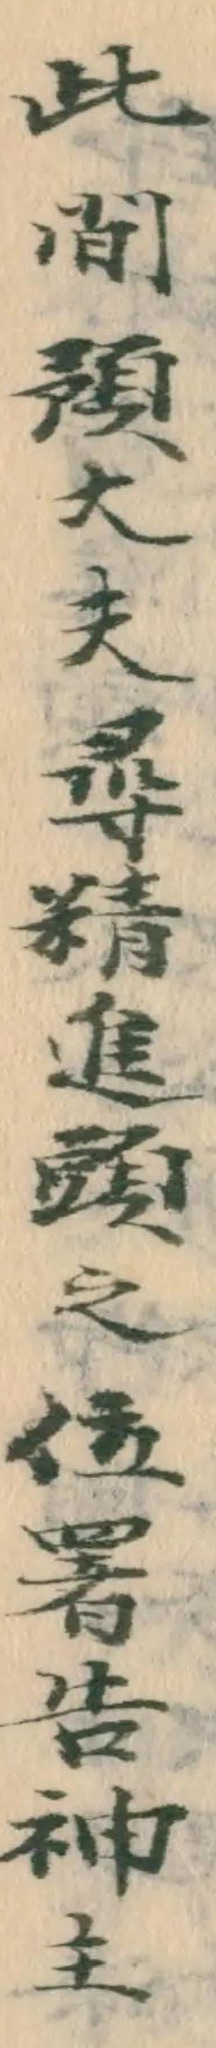此間預大夫尋精進頭之位署告神主
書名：賀茂社記録. 第5冊
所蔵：国立国会図書館 National Diet Library, JAPAN
